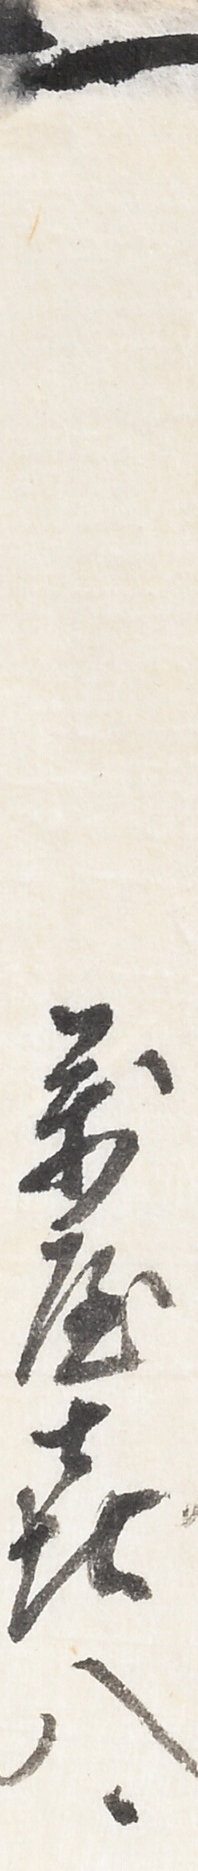一万屋喜八・
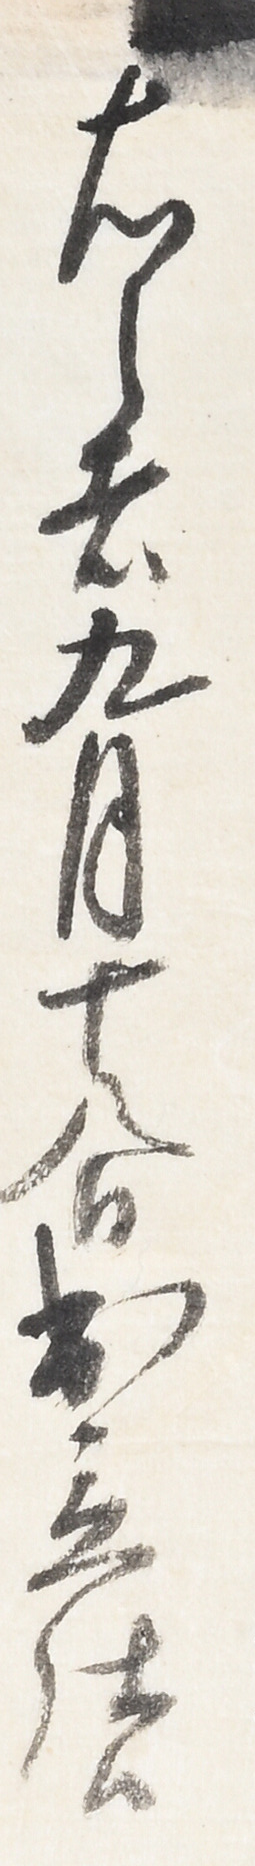右之者九月十八日出立仕候
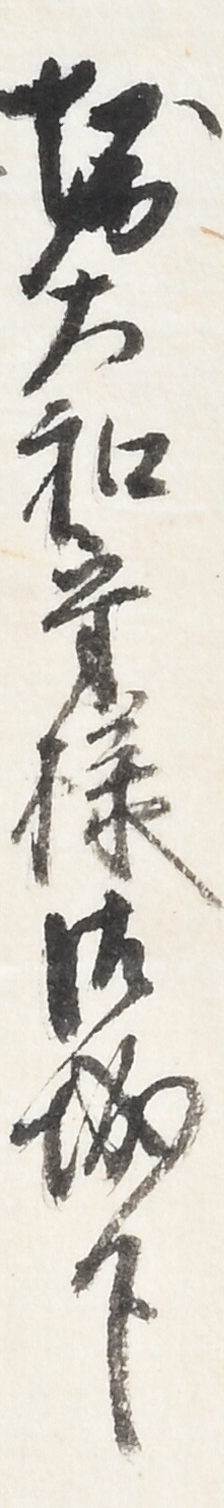堀大和守様御城下
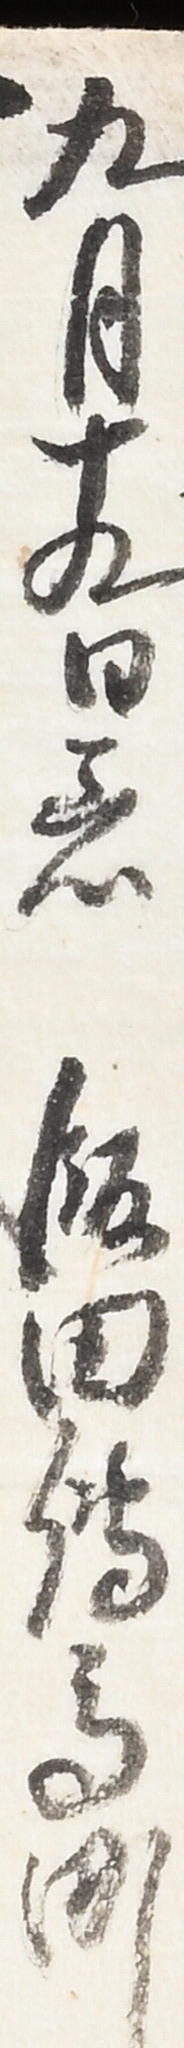九月十九日着飯田伝馬町
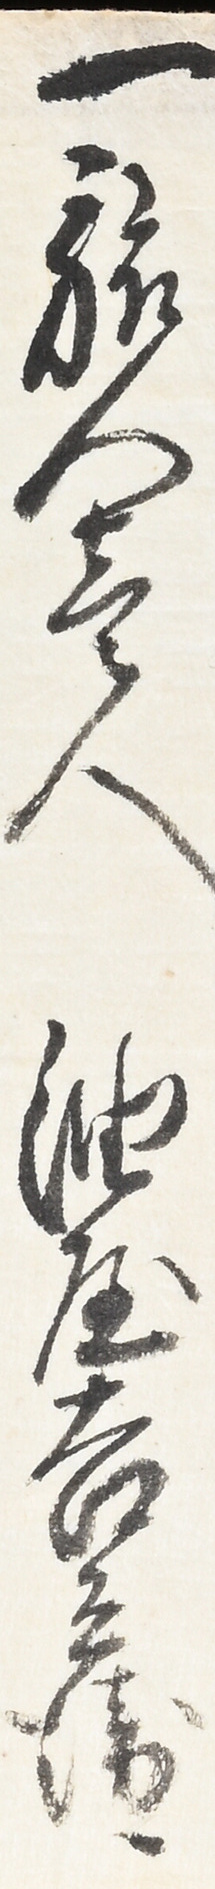一旅人壱人油屋吉兵衛・
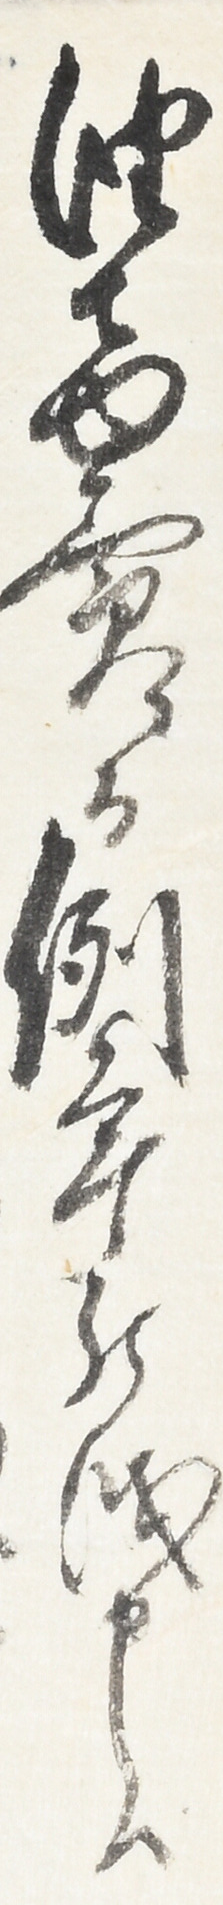油商売ニ而例年罷越申候
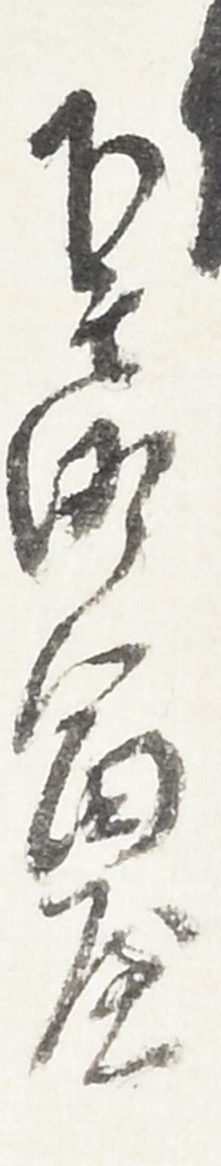下モ町冨屋
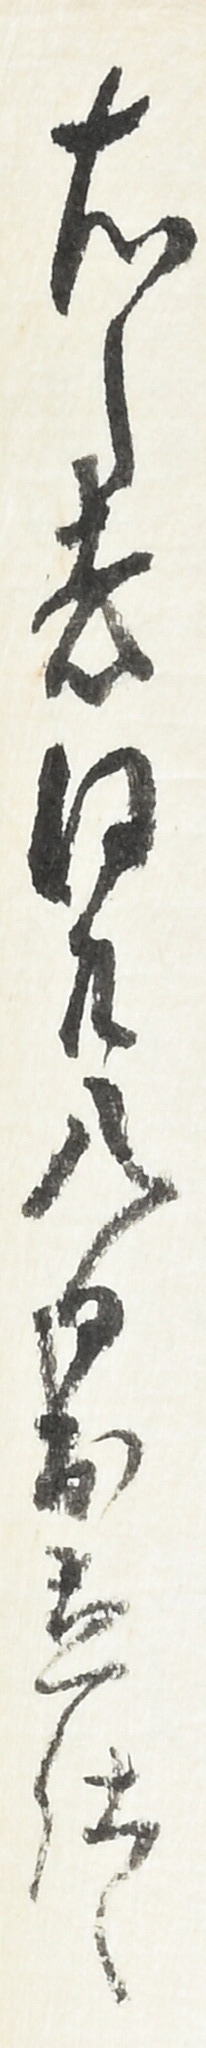右之者同廿八日出立仕候
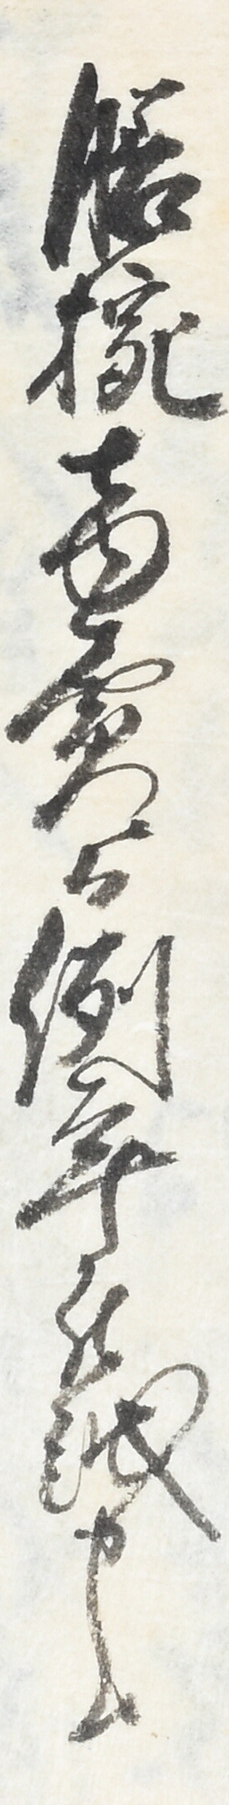小間物商売ニ而例年罷越申候

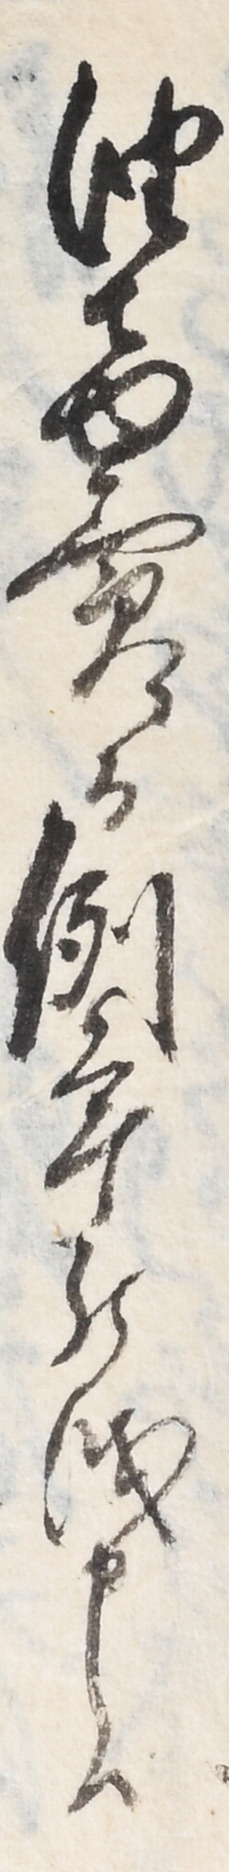膳椀商売ニ而例年罷越申候
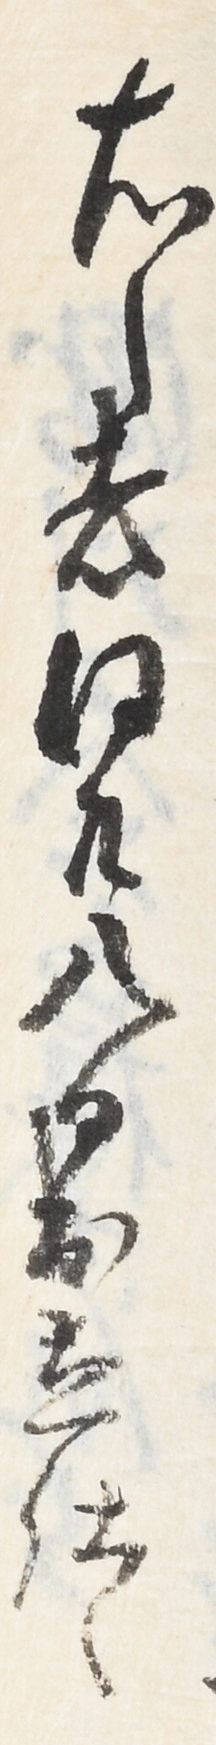右之者同廿八日出立仕候
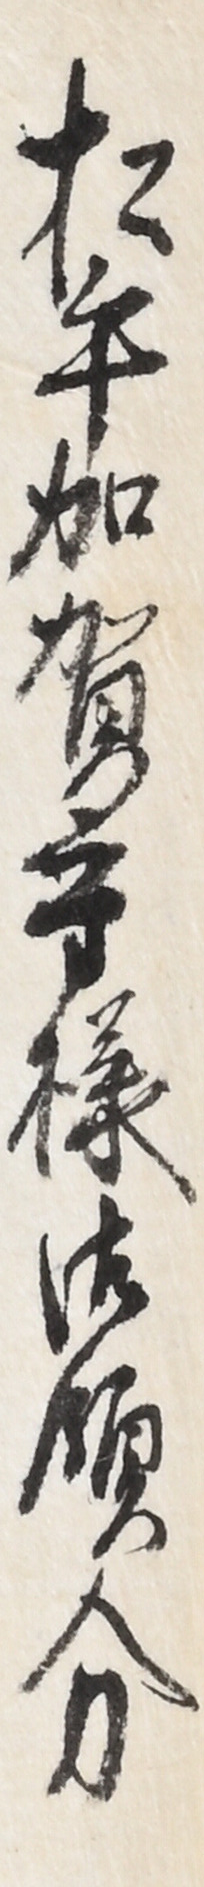松平加賀守様御領分
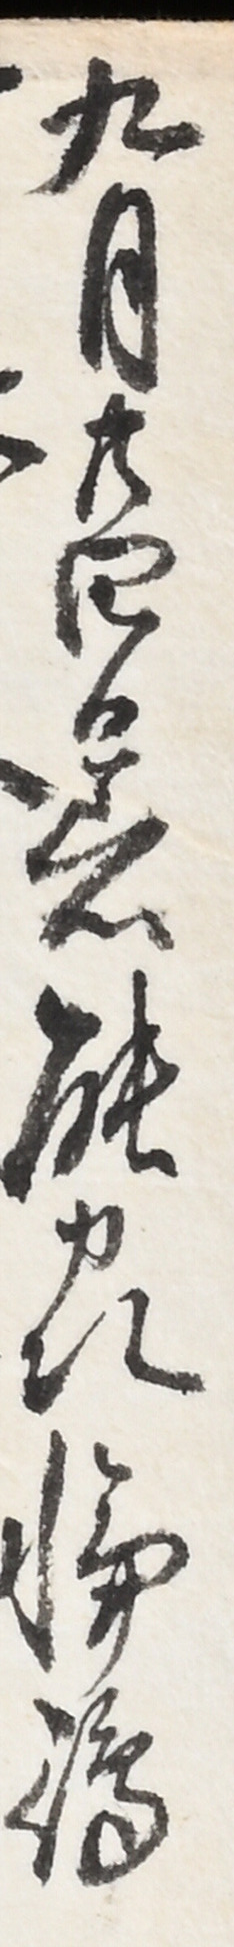九月廿四日着能州輪嶋
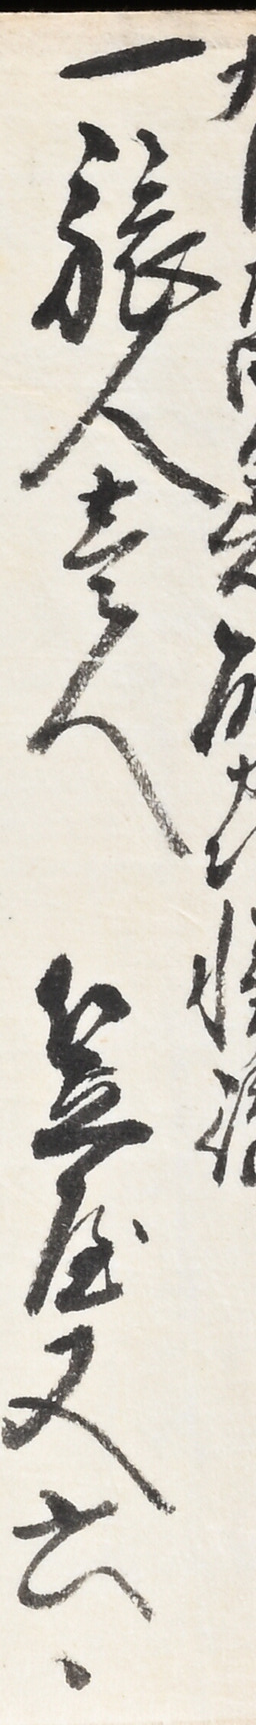一旅人壱人笠屋又六・
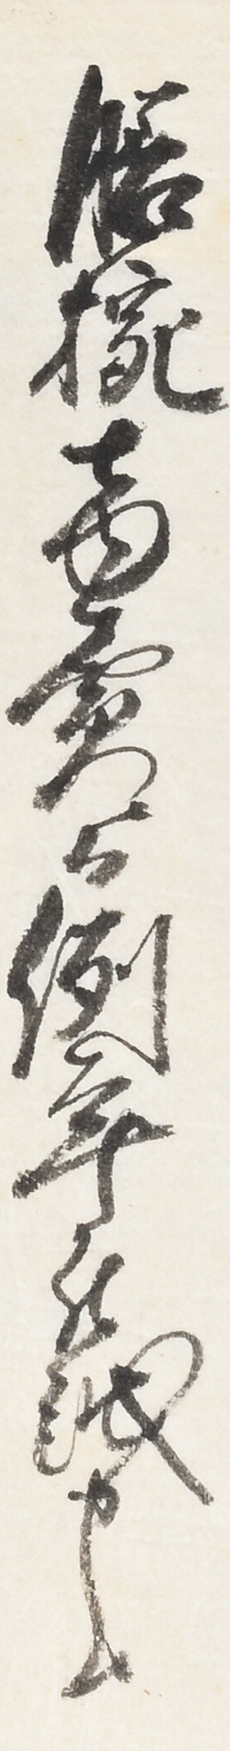膳椀商売ニ而例年罷越申候
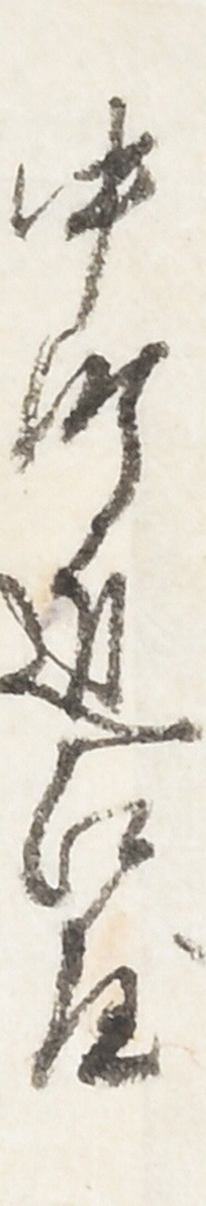中町近江屋
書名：旅人泊控帳
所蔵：伊那市立高遠町図書館・合同会社AMANE
